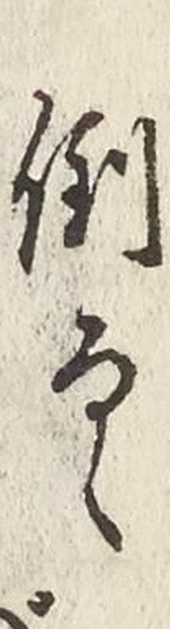倒るゝ

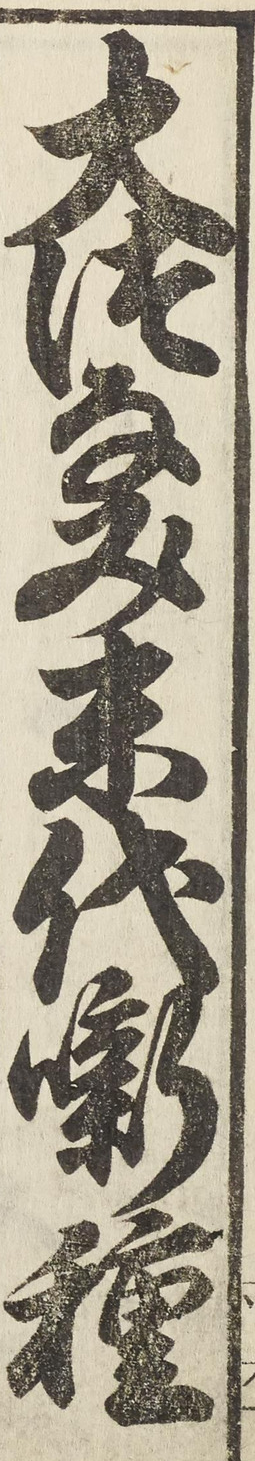大つなみ末代噺種
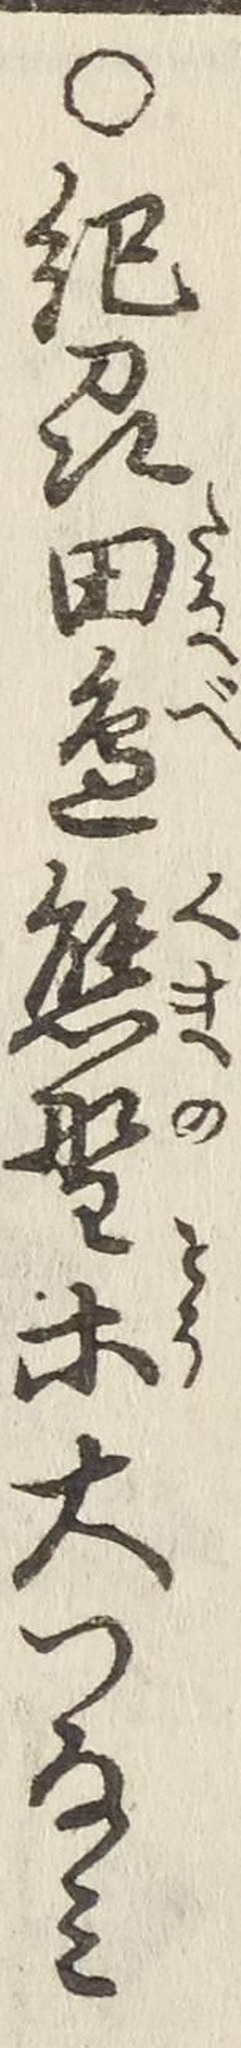○紀州田辺熊野等大つなみ
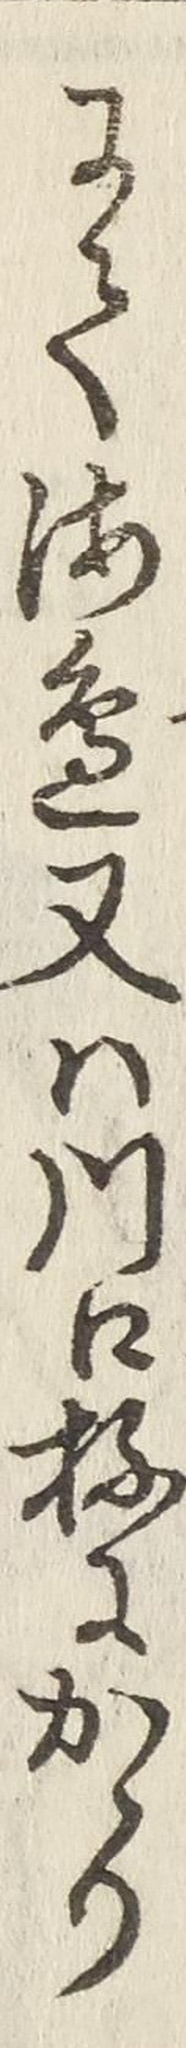にて海辺又は川口抔にかゝり
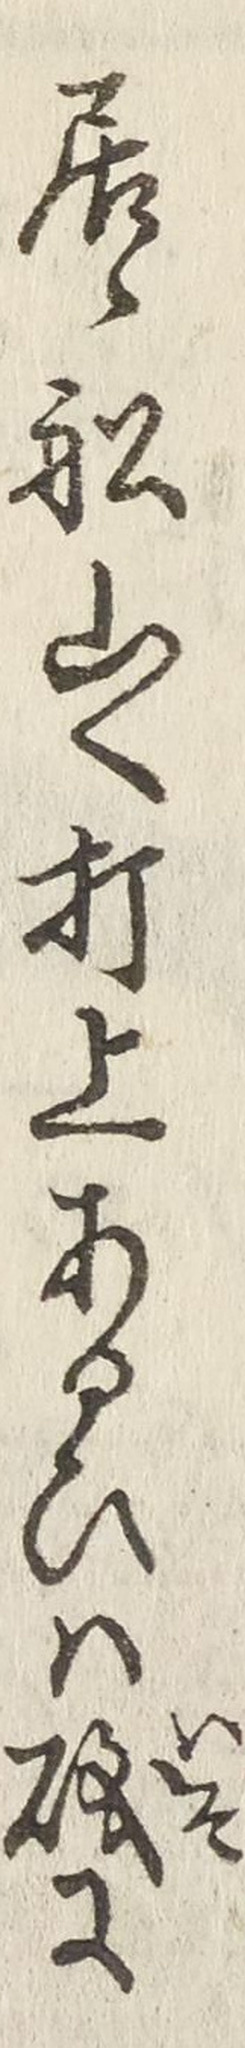居候船山へ打上あるひは磯に
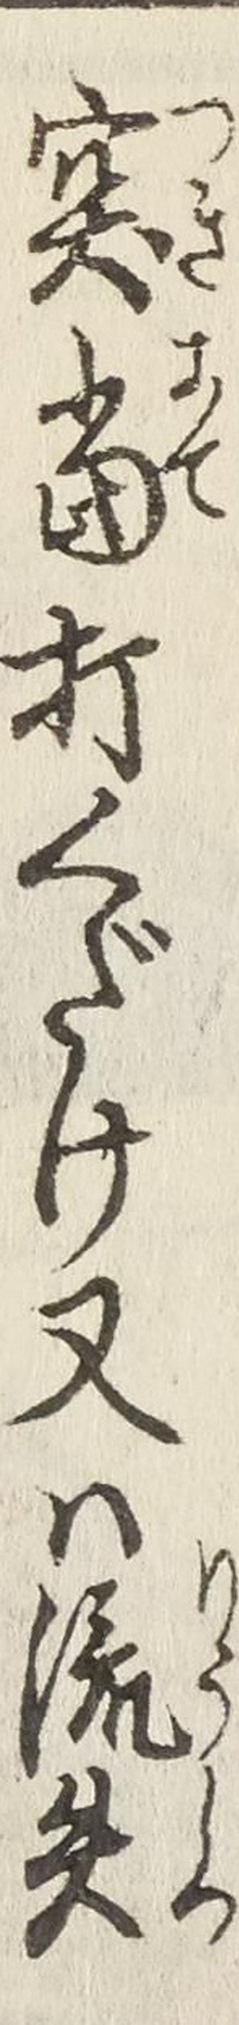突当打くだけ又は流失
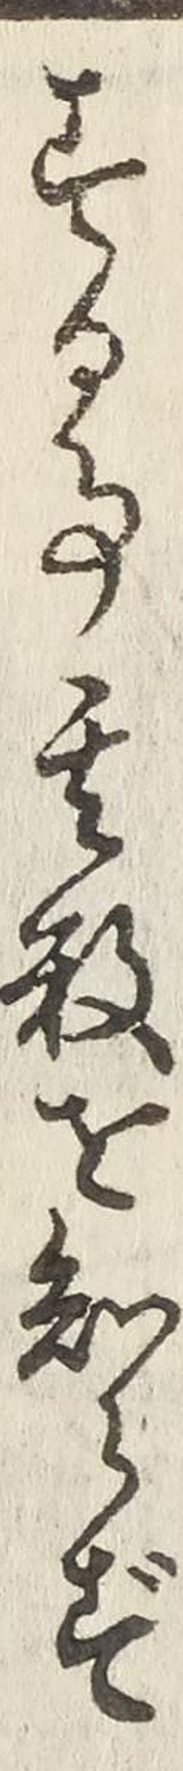する事其数を知らず
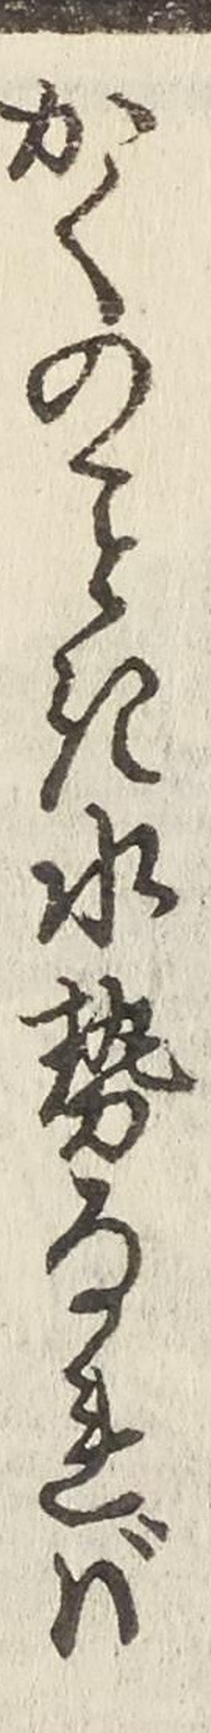かくのことき水勢なれば
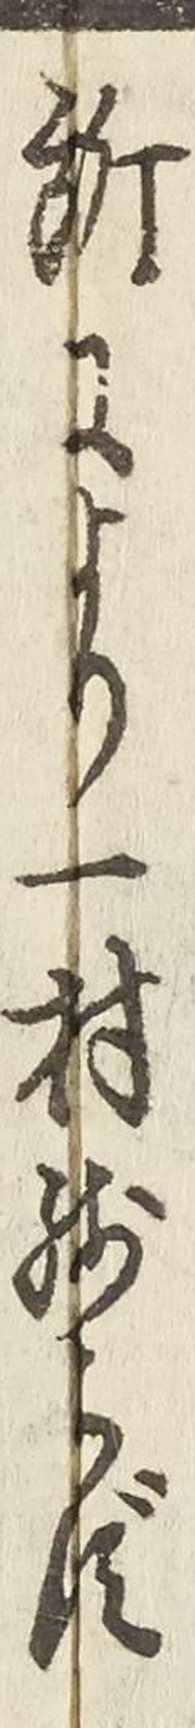所により一村残らず
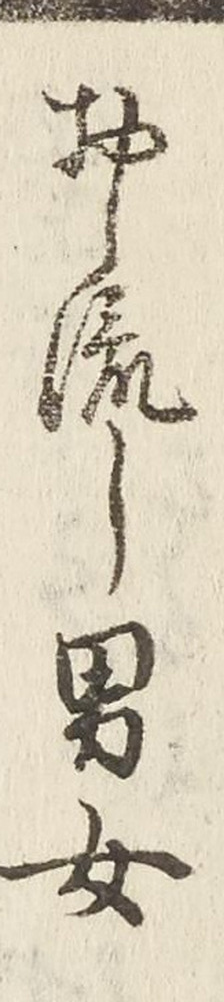おし流し男女
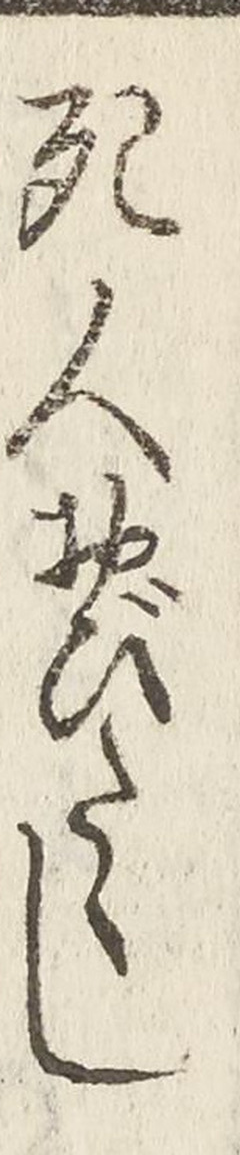死人おびたゝし
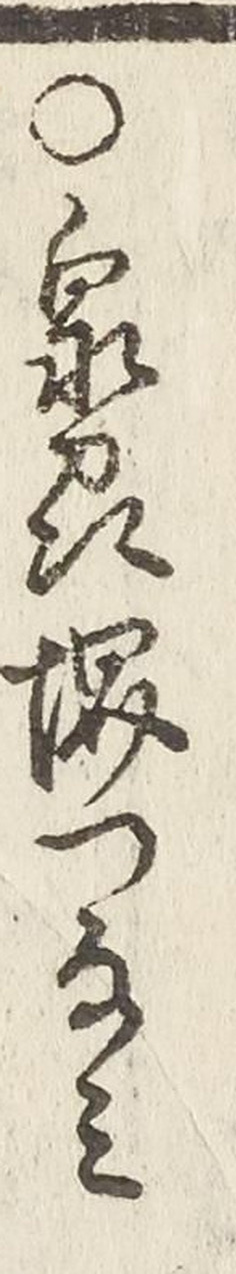○泉州堺つなみ
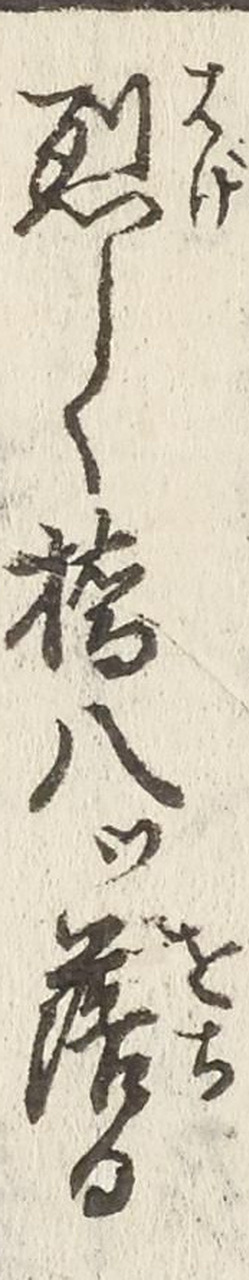烈しく橋八つ落る
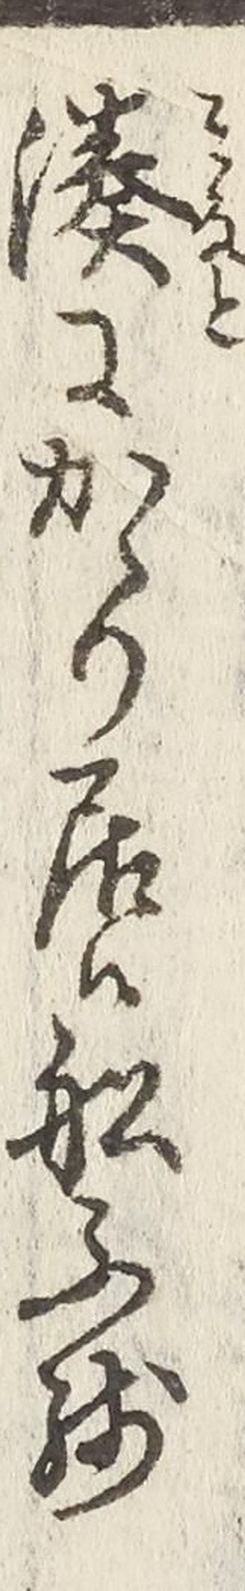湊にかゝり居候船不残
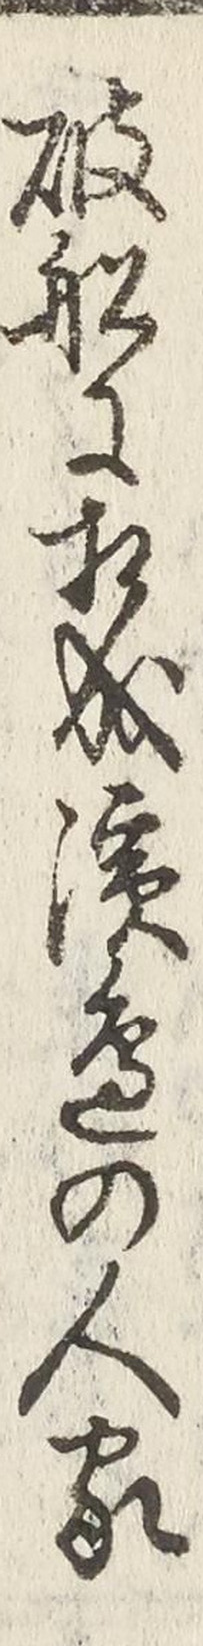破船に相成浜辺の人家
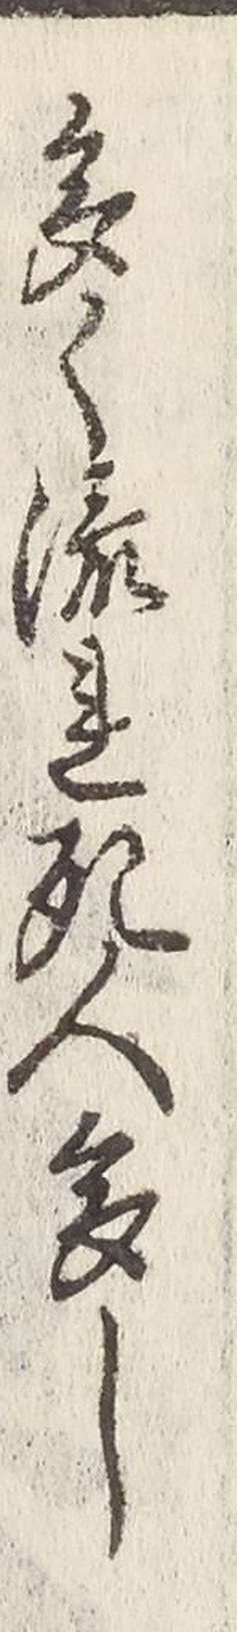多く流れ死人多し
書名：大地震大津浪末代噺種　（二編　全）
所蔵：東京大学地震研究所図書室 Earthquake Research Institute Library, The University of Tokyo, JAPAN
